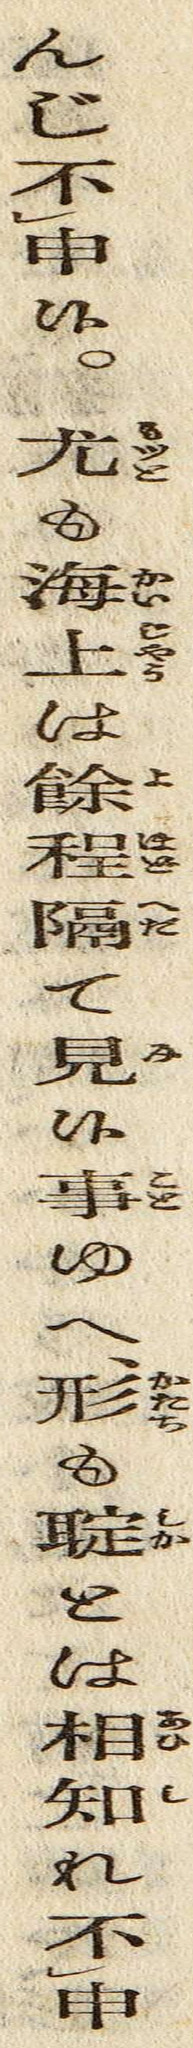んじ不申候。尤も海上は余程隔て見候事ゆへ、形も聢とは相知れ不申
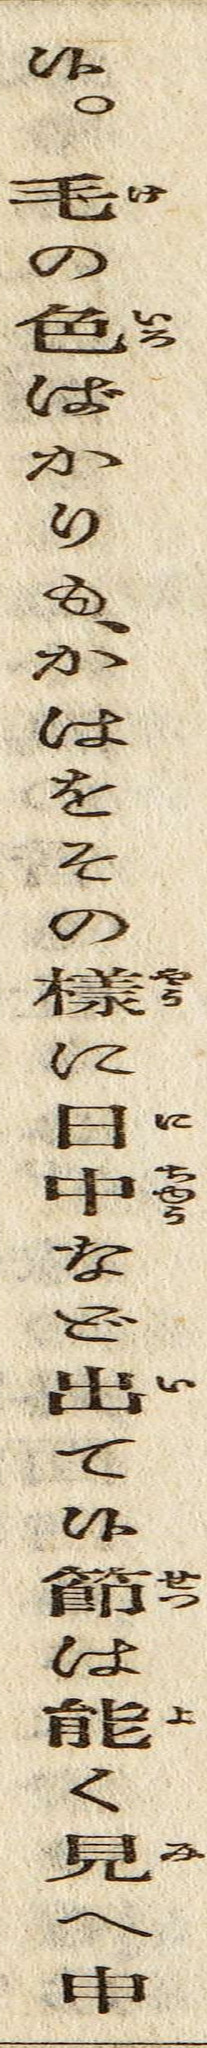候。毛の色ばかりも、かはをその様に日中など出て候節は能く見へ申
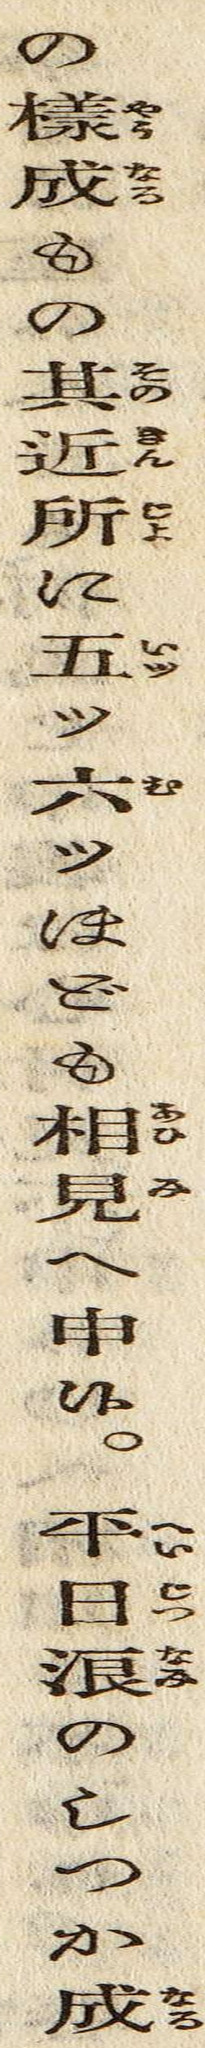の様成もの其近所に五ツ六ツほども相見へ申候。平日浪のしつか成
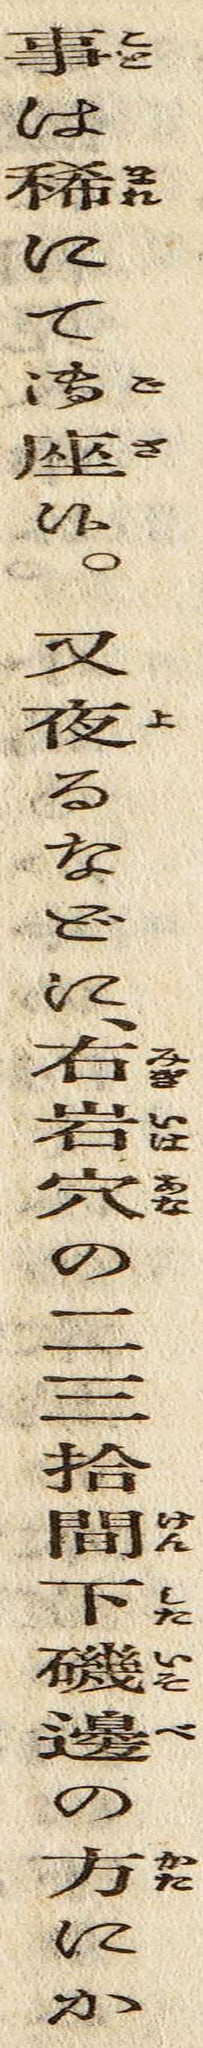事は稀にて御座候。又夜るなどに、右岩穴二三拾間下磯辺の方にか
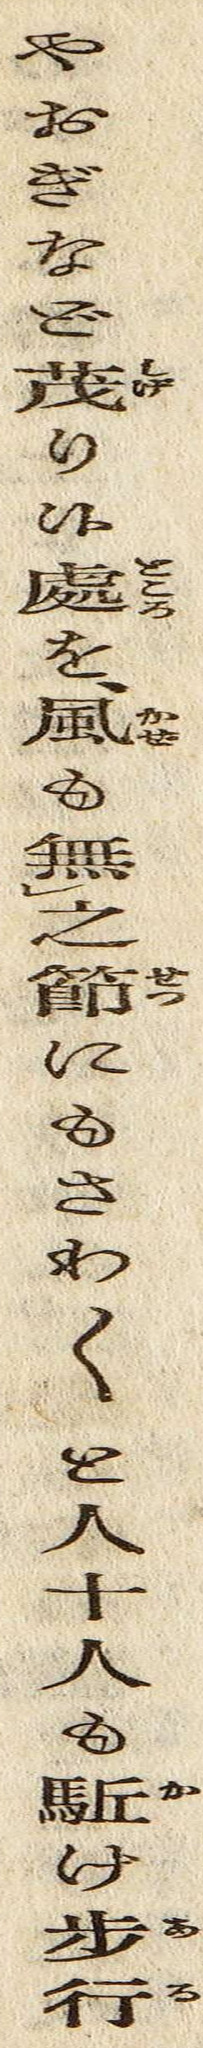やおぎなど茂り候処を、風も無野節にもさわ〳〵と人十人も駈け歩行
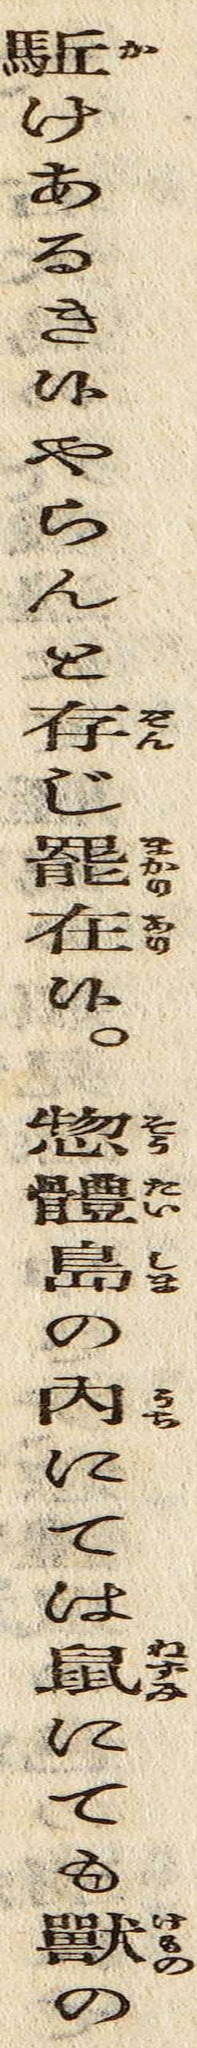駈けあるき候やらんと存じ罷在候。総体島の内にては鼠にても獣の
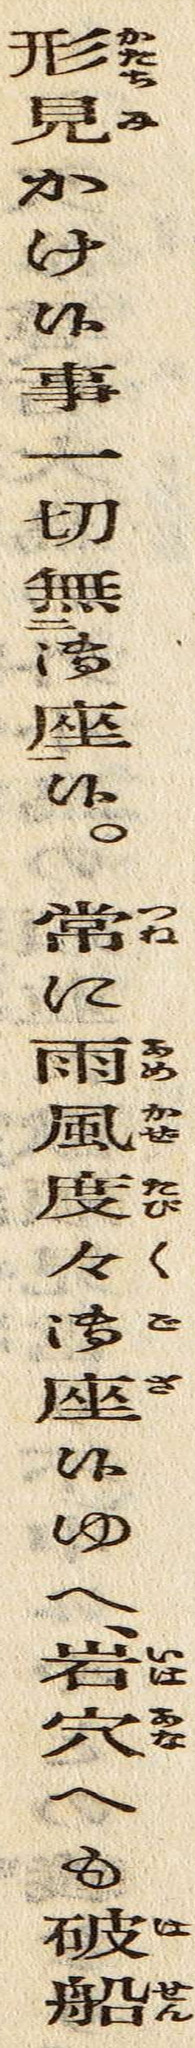形見かけ候事一切無御座候。常に雨風度々御座候ゆへ、岩穴へも破船
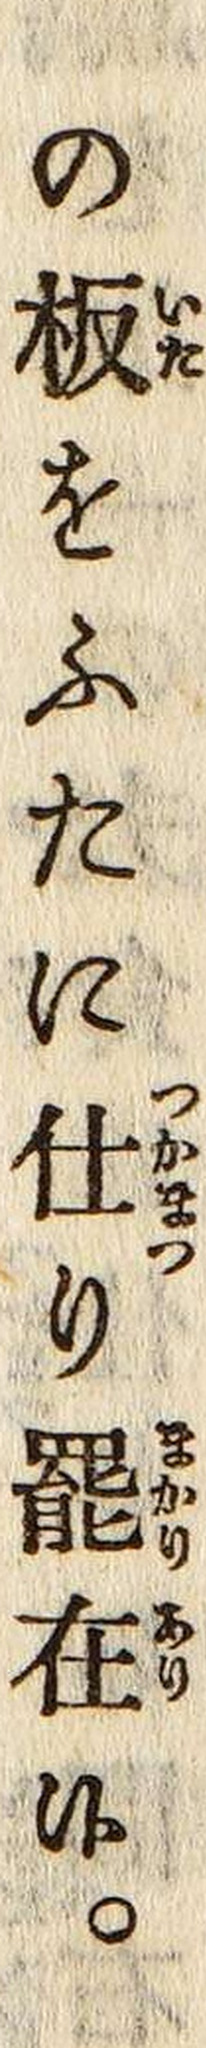の板をふたに仕り罷在候。
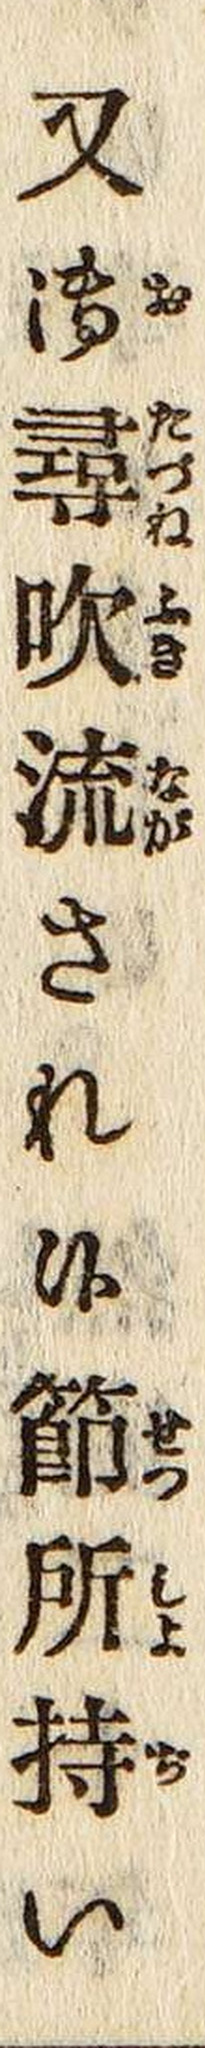又御尋吹流され候節所持い
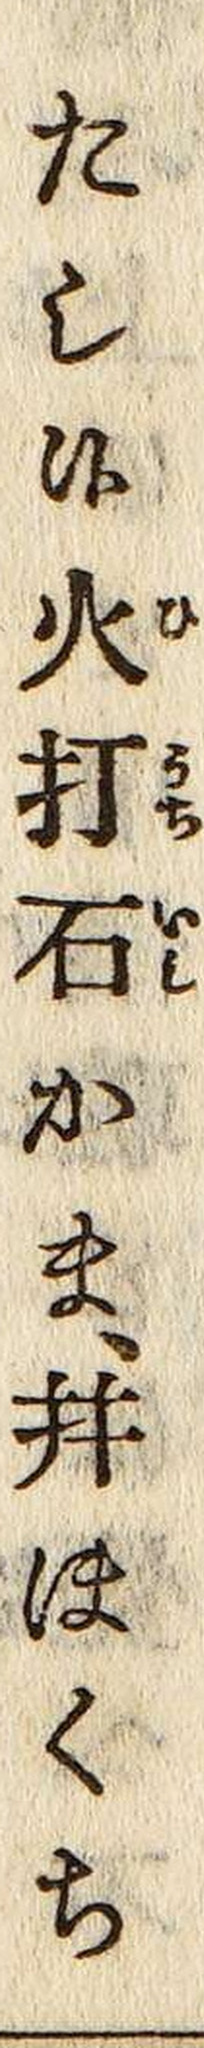たし候火打石かま、并ほくち
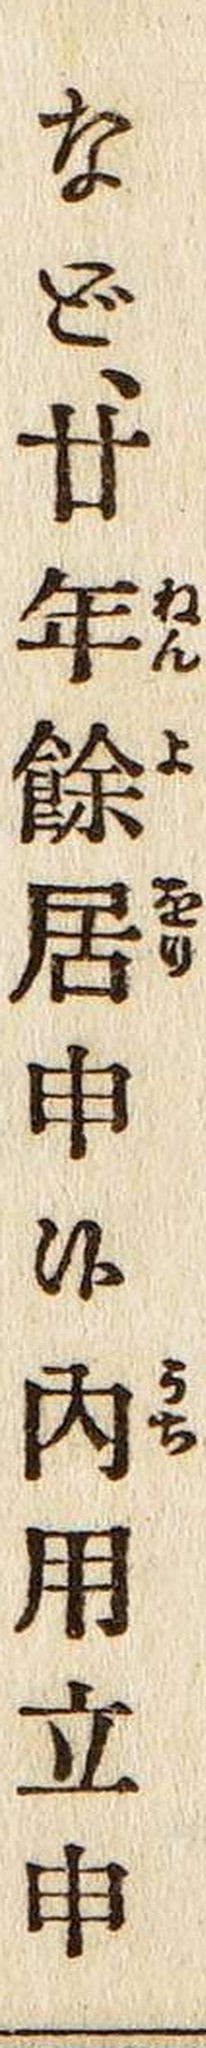など、廿年余居申候内用立申
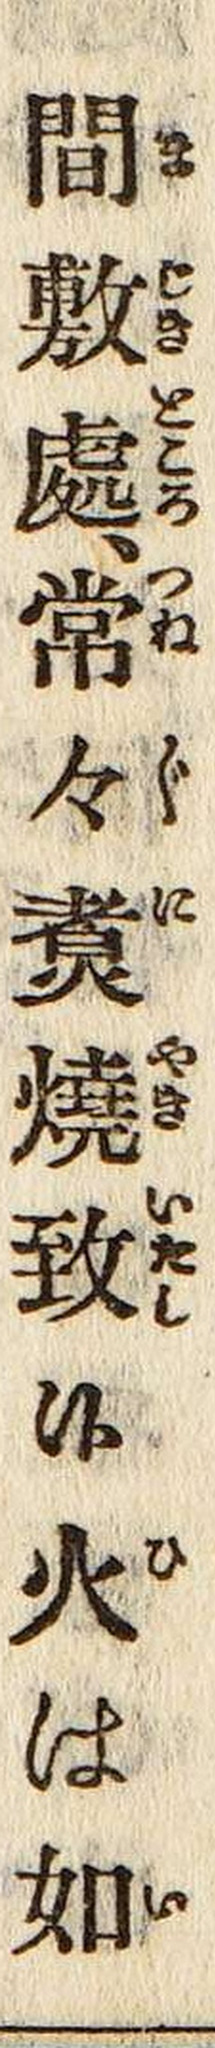間敷処、常々煮焼致候火は如
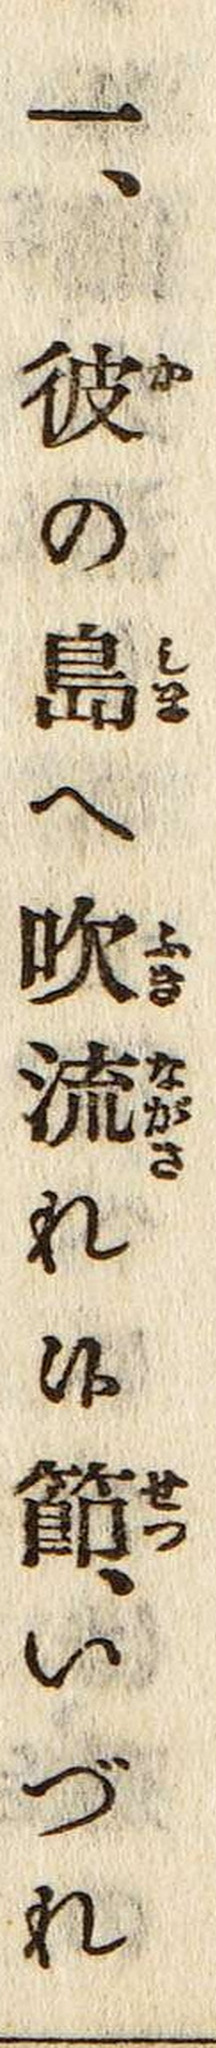一、彼の島へ吹流れ候節、いづれ
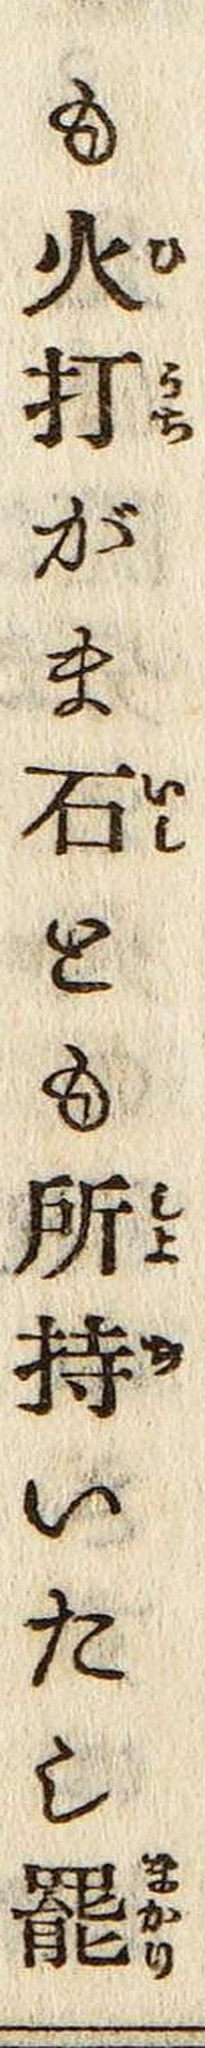も火打がま石とも所持いたし罷
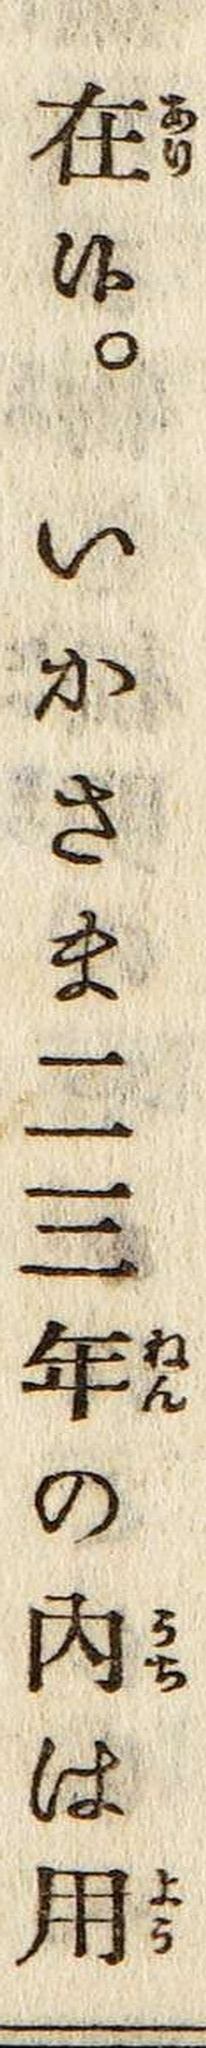在候。いかさま二三年の内は用
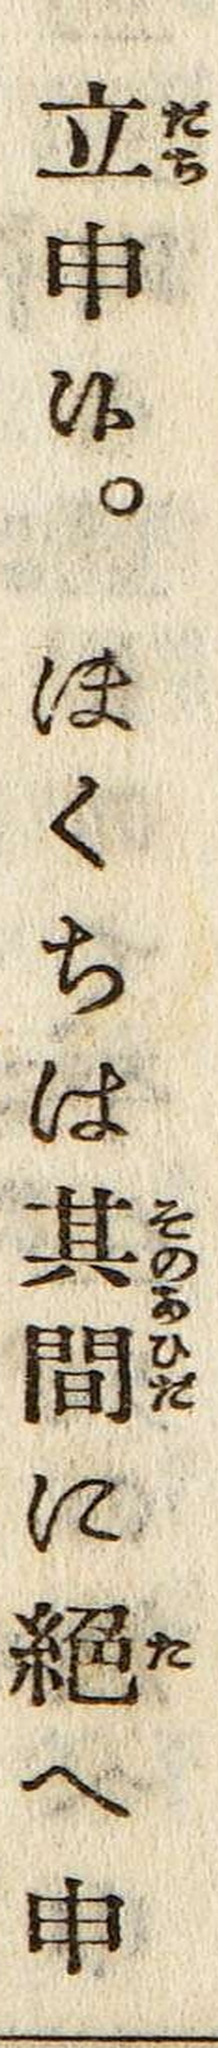立申候。ほくちは其間に絶へ申
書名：日本漂流譚
